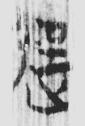{辶坐}
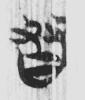{友日}（友）
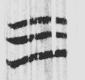三
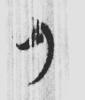人
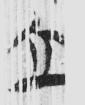立
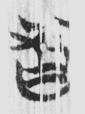{友日}（友）
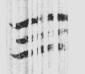三
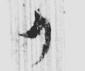人
